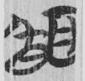䎽（問）
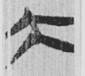大（太）
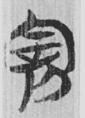○（宰）
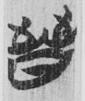晉
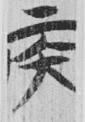侯
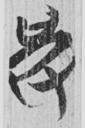皮（彼）
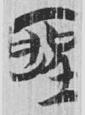聖
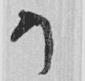人
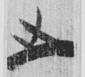之
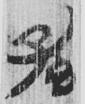孫子
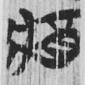𨟻（將）
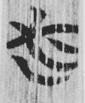必
